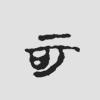可
